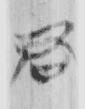君
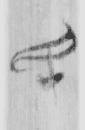民
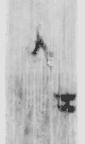人=
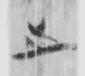之
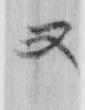又
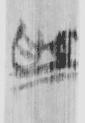爲
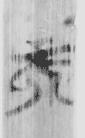而
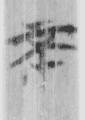不
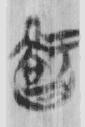智
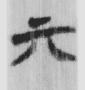亓
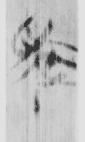卒B
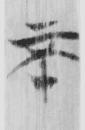不
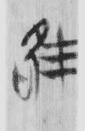唯
